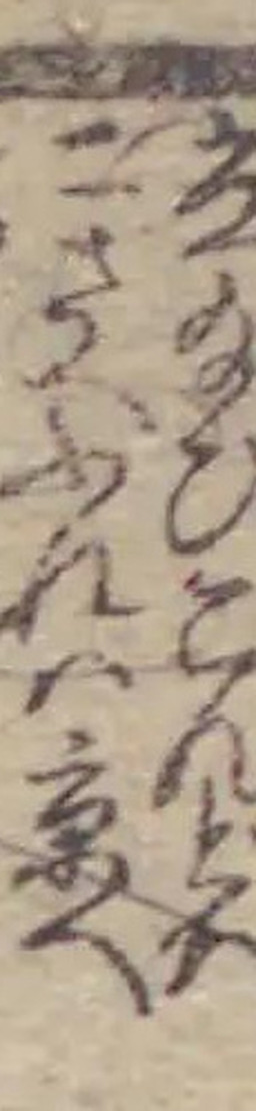二さへふれは京へ
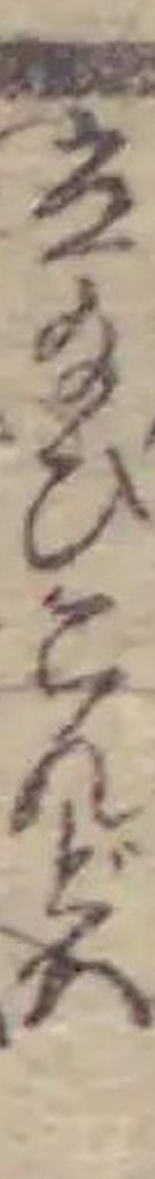立給ひこんどは
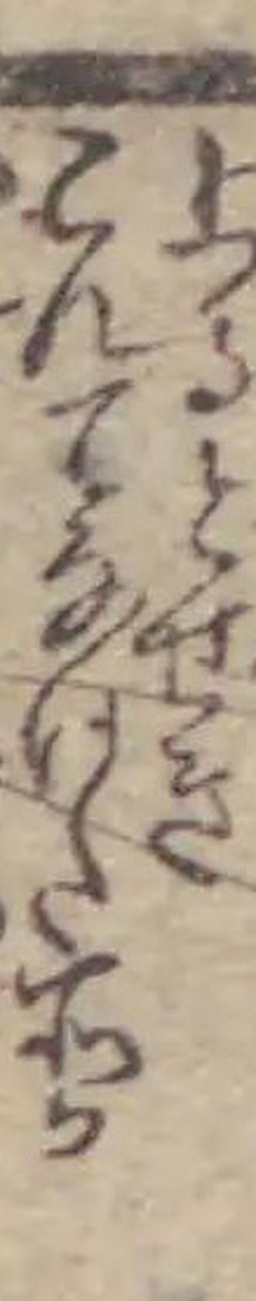こんてなけた所か
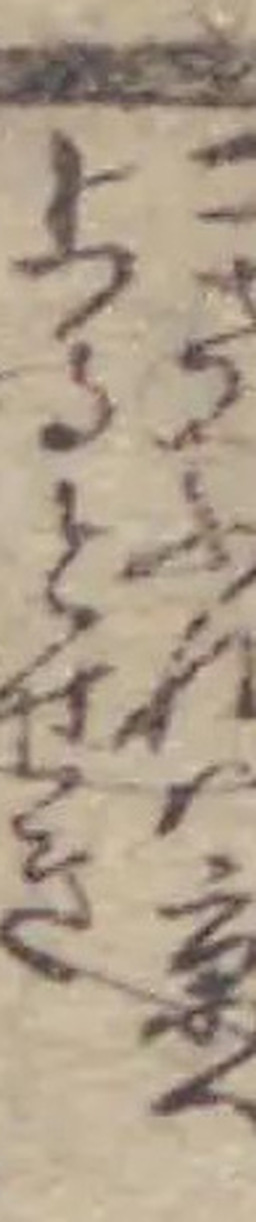上るとせき
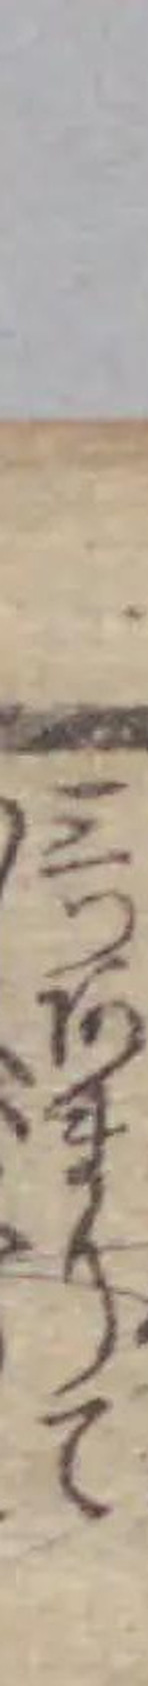三つあまりて
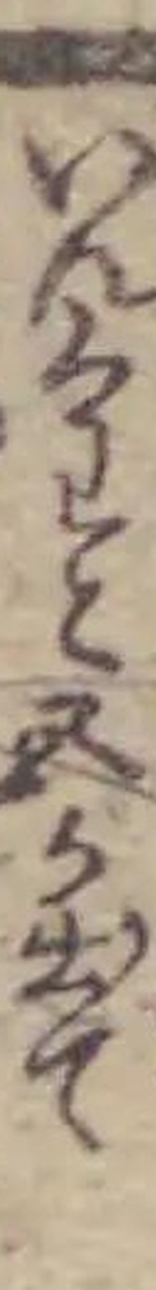いんくわと五か出て
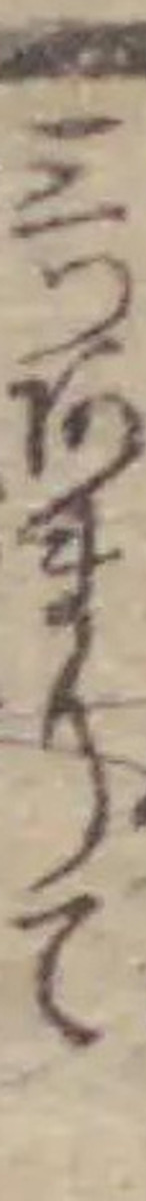三つあまりて
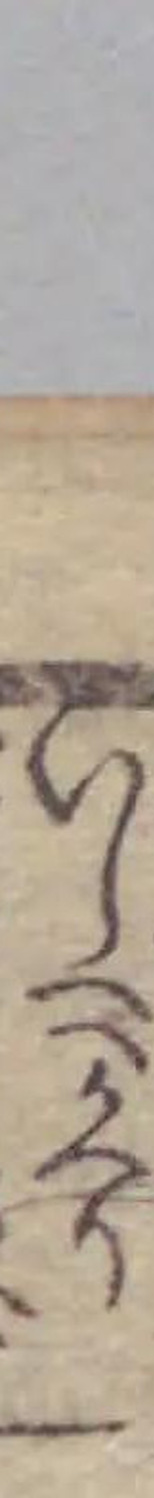いしへへかへり
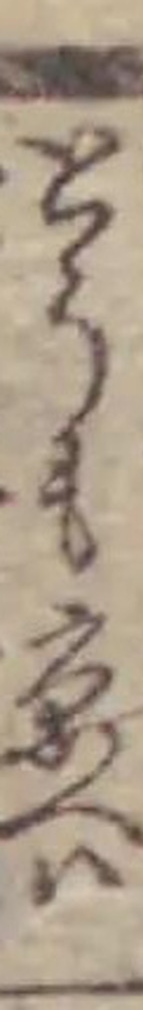とうも京へは
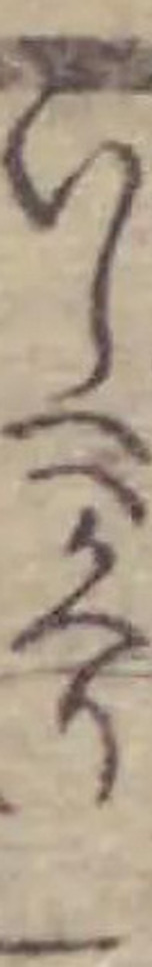いしへへかへり
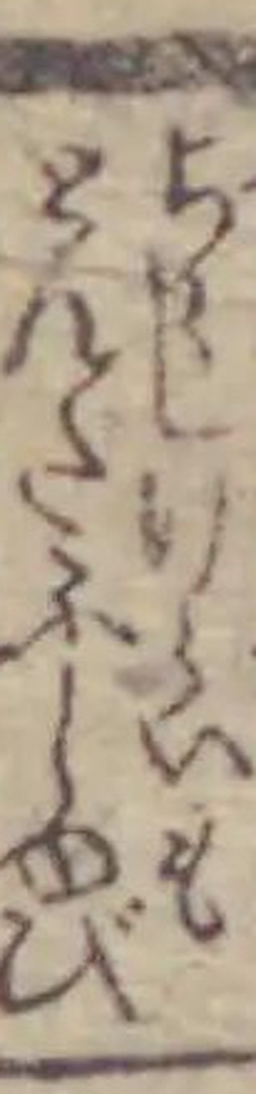とんたふしゆび
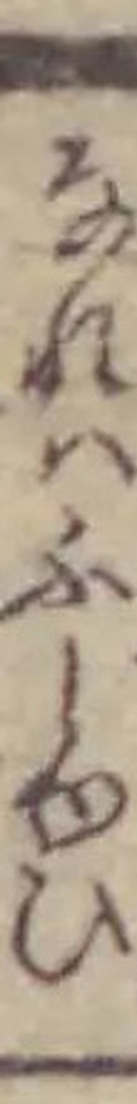なれはふしゆひ
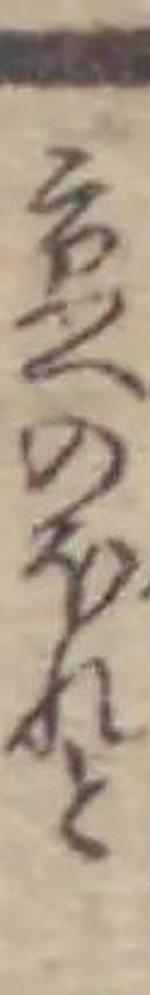京へのほれと
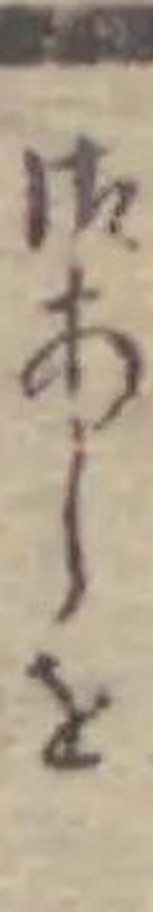御あしを
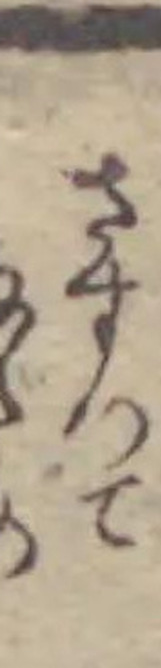さすつて
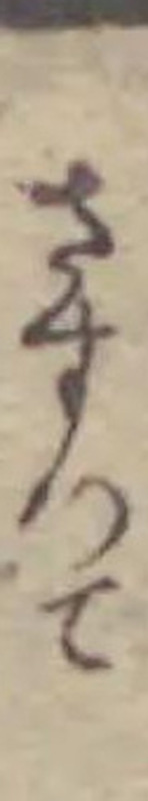さすつて
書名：道笑双六
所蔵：国立国会図書館 National Diet Library, JAPAN
